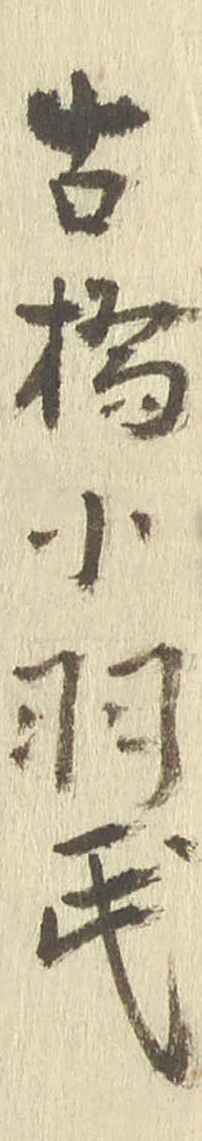古橋小羽氏
